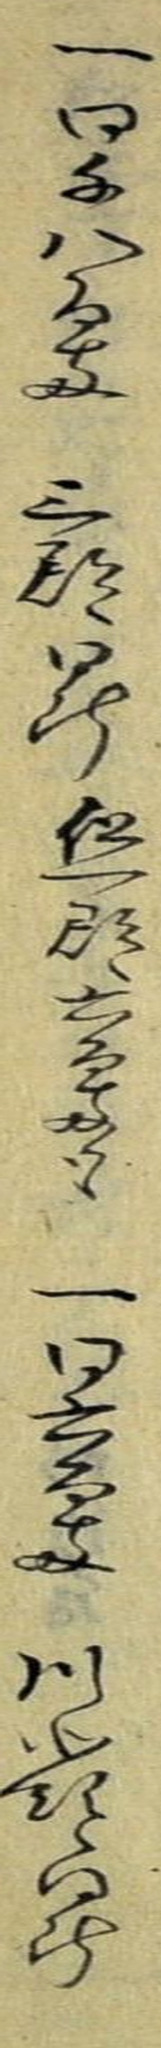一同千八百両三郡へ同断但一郡へ六百両ツヽ一同六百両川北領へ同断
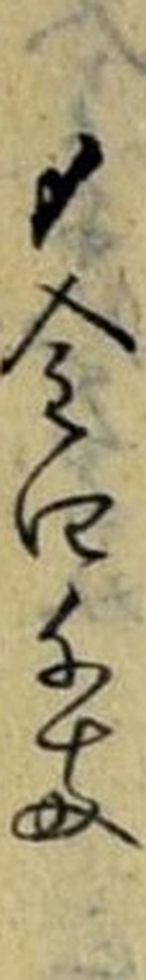〆金四千両
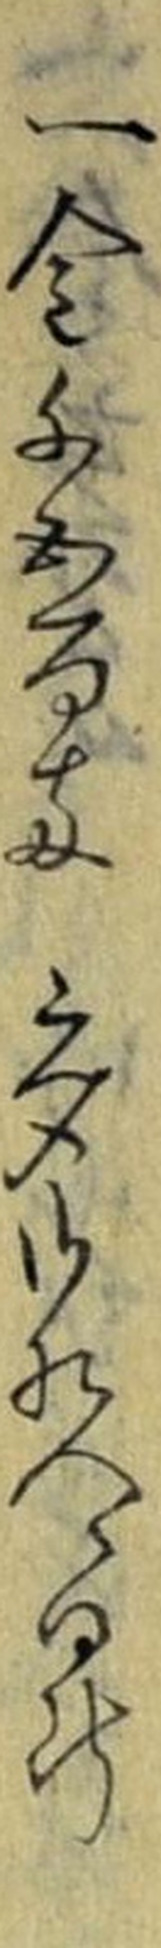一金千五百両元〆御役人へ同断
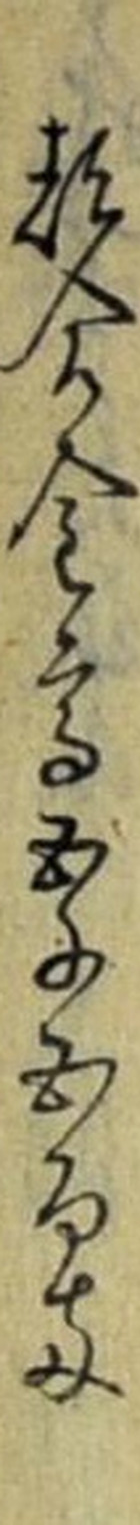都合金高五千五百両
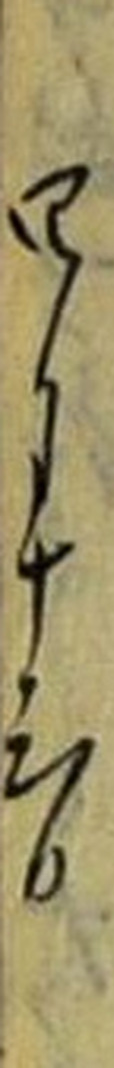四月十三日
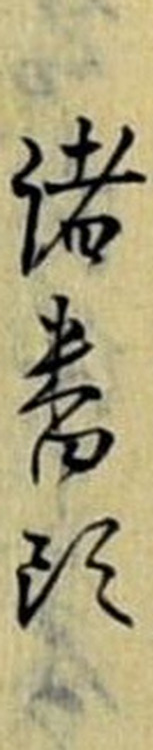諸番頭
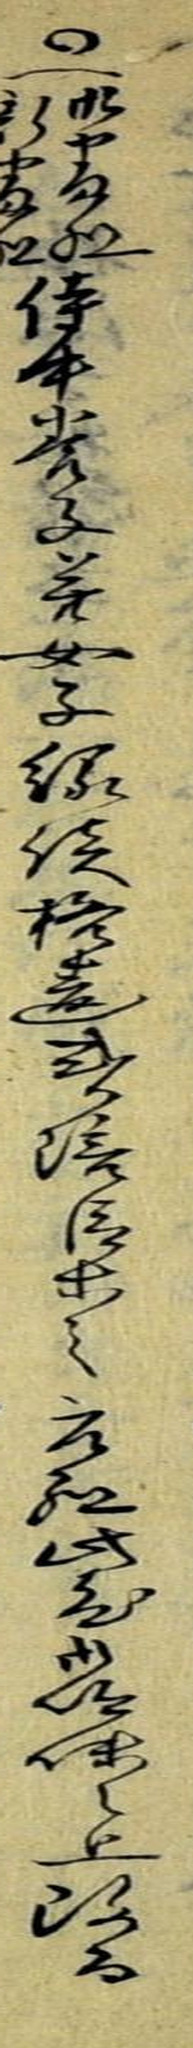新番組侍中養子并女子縁談格違或ハ陪臣等之取組此度御吟味之上改而
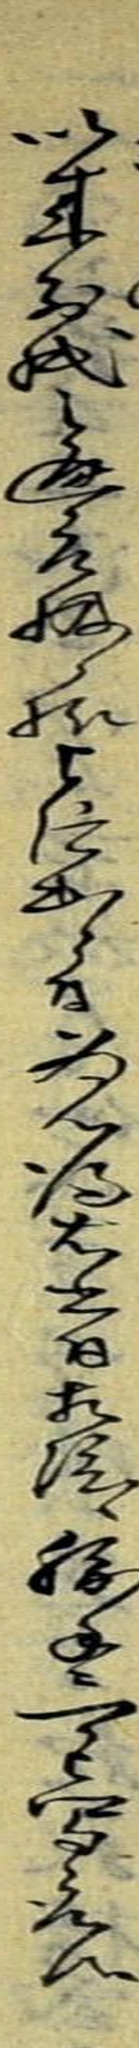以来別紙之通取扱候様被仰出候ニ付為心得右書付相渡候勝手ニ可被写取候
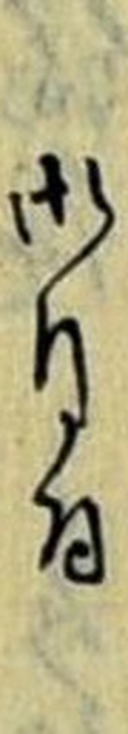御目付
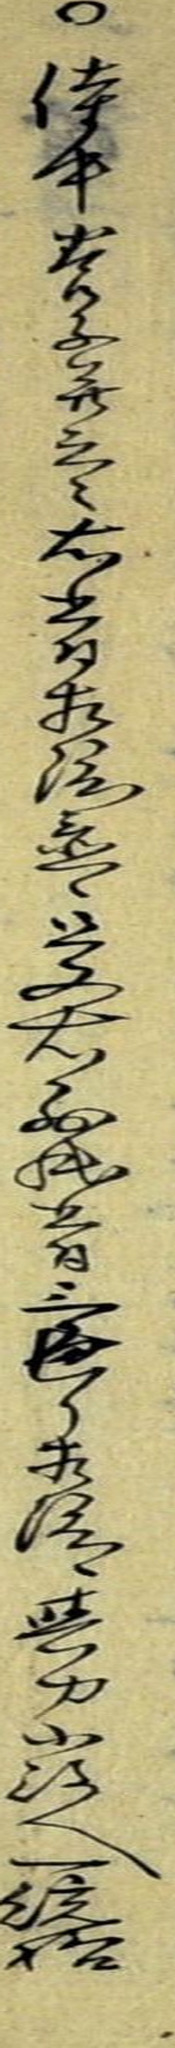〇侍中養子并云々右書付相渡置候且又右別紙書付三通り相渡候与力小役人一統格
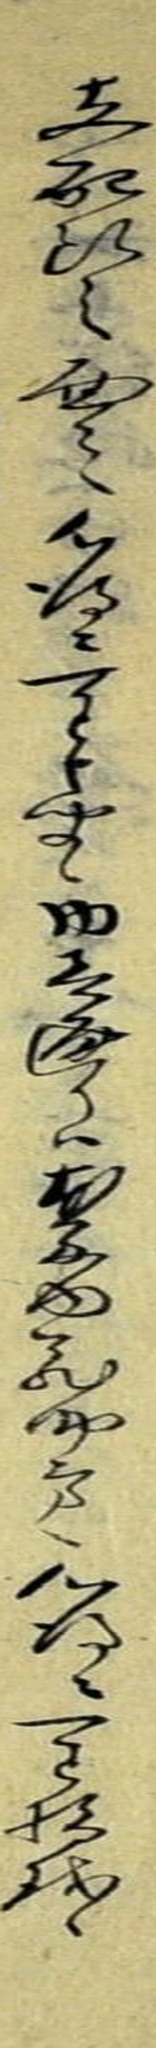支配頭之面々へ心得ニ可被申聞候内壱通りハ本多内蔵助方へ心得ニ可被指越候
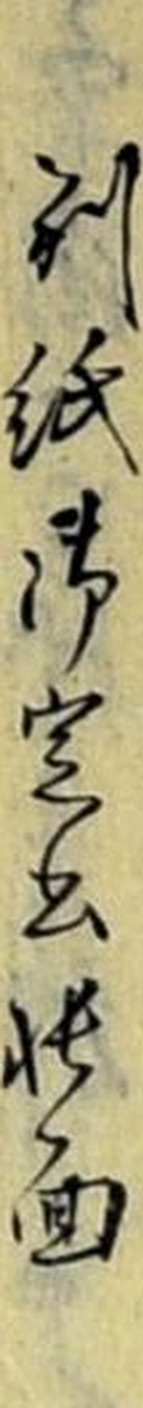別紙御定書帳面
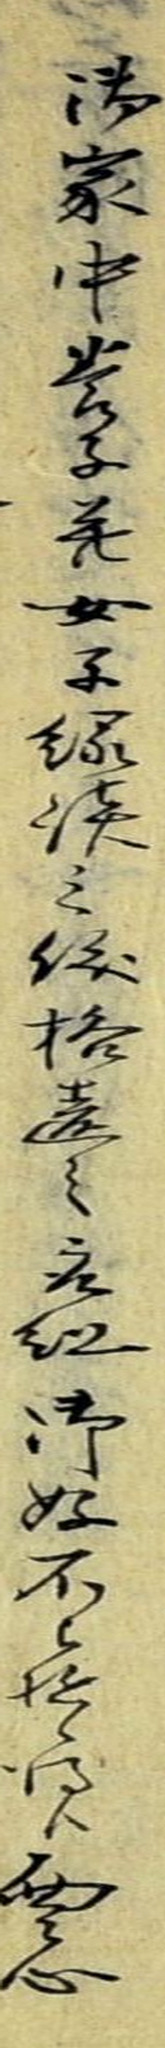御家中養子并女子縁談之儀各格違之取組御好不被遊候得ハ面々心
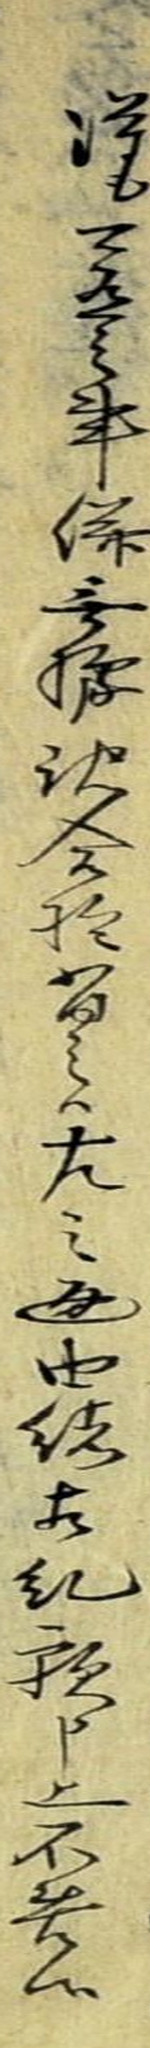得も可有之事併無拠訳合於有之ハ左之通由緒相糺願申上不苦候
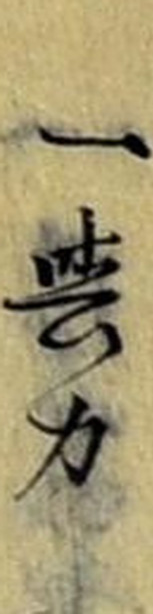一与力
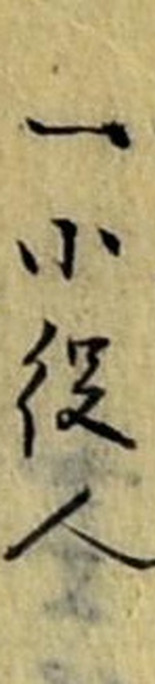一小役人
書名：命令之部 三
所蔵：福井県文書館 Fukui Prefectural Archives
